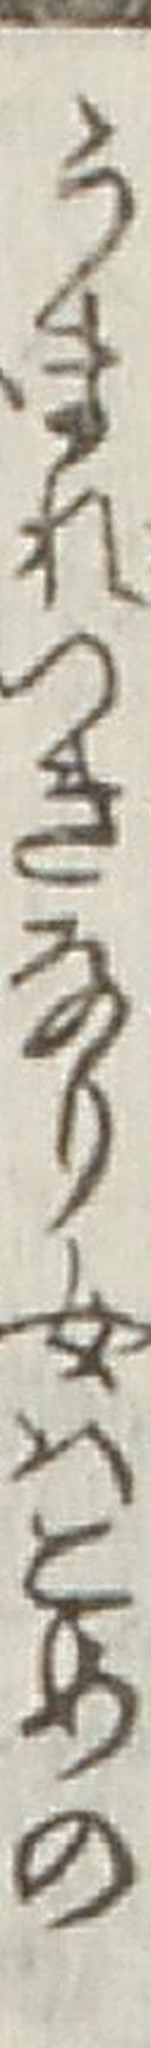うまれつきなり女はこめの
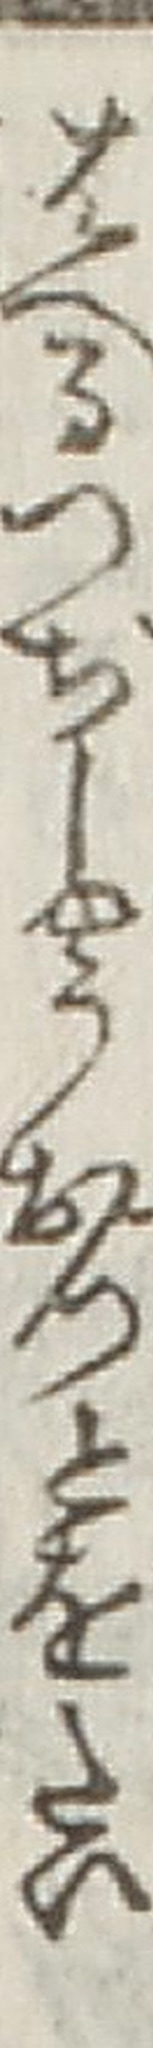はへるつちしやうおつとをたい
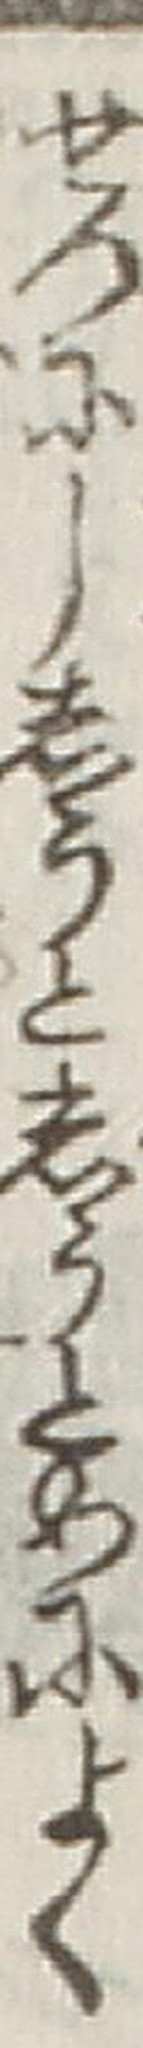せつにししうとしうとめによく
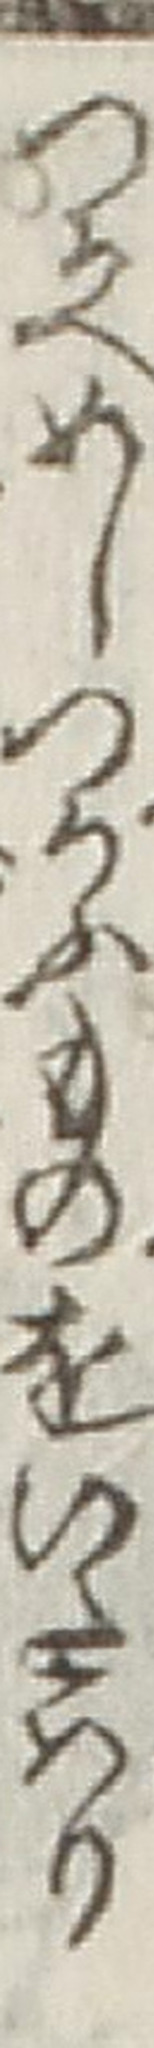つかへめしつかふものをいたはり
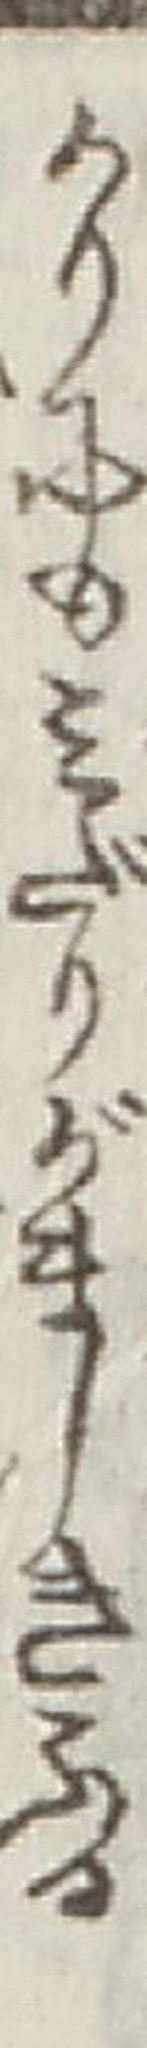かりにもみだりがましきふる
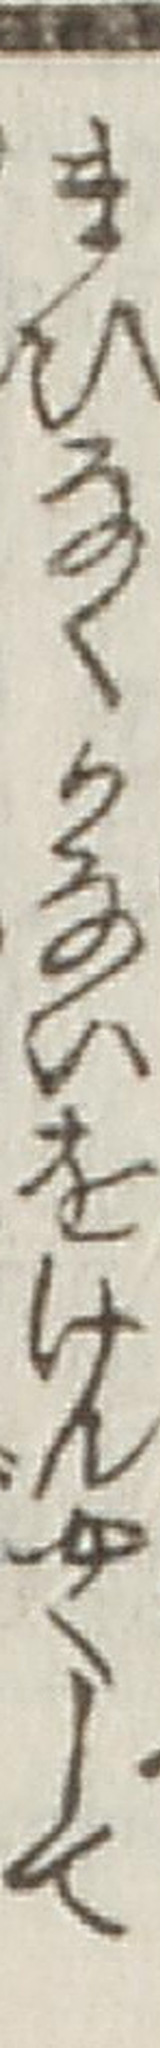まひなくかないをけんやくして
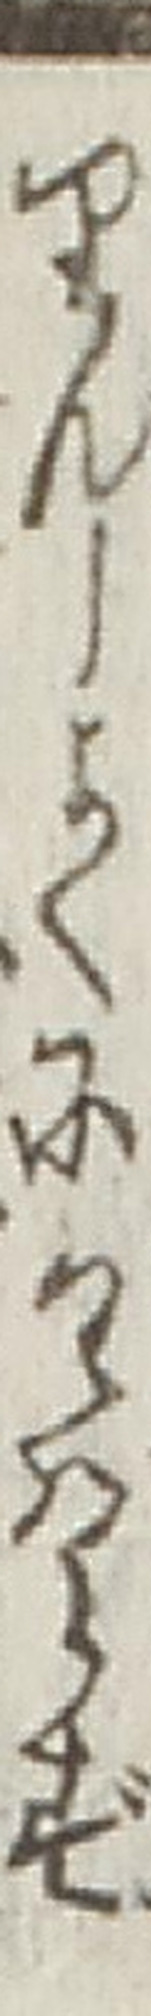りんしよくにかゝはらず
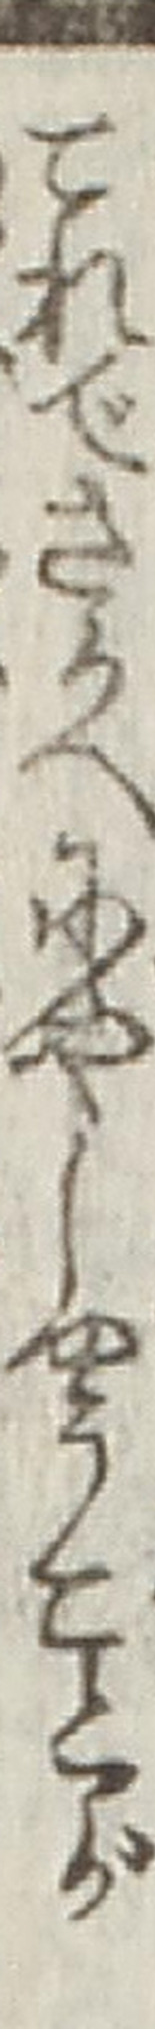これでさかへにやしやうことが
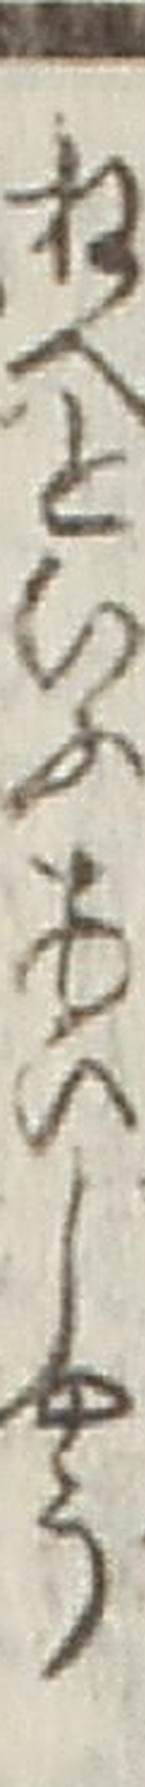ねへというあいしやう
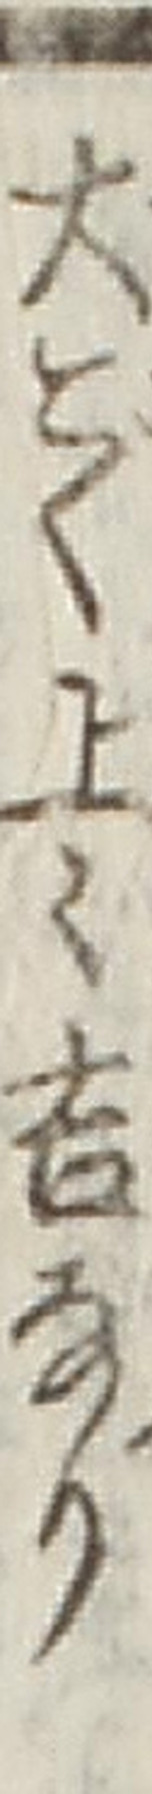大こく上〻吉なり
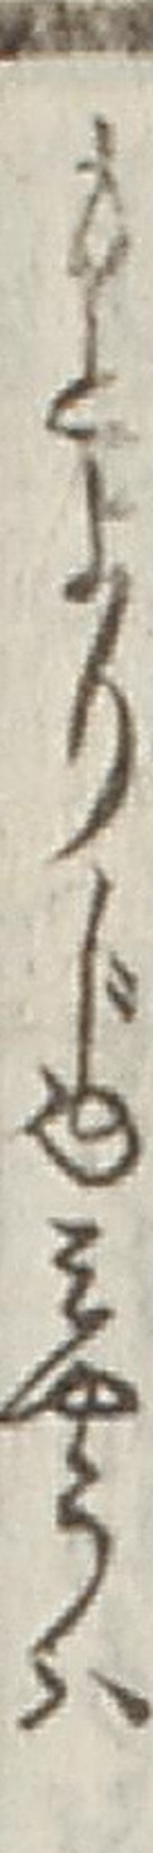もとよりじゆみやうは
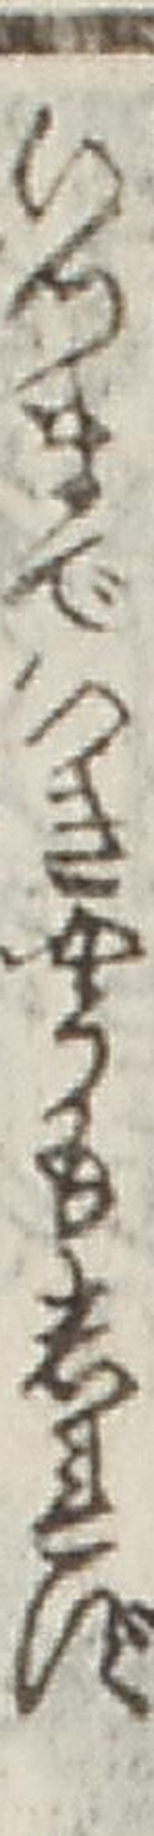いつまでつきやうもしれず
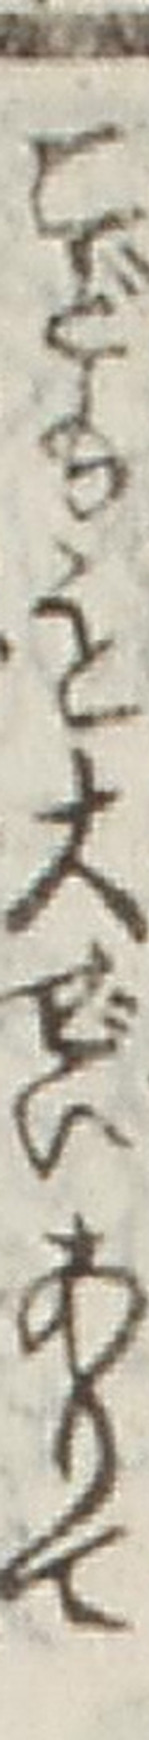こどもも大ぜいありて
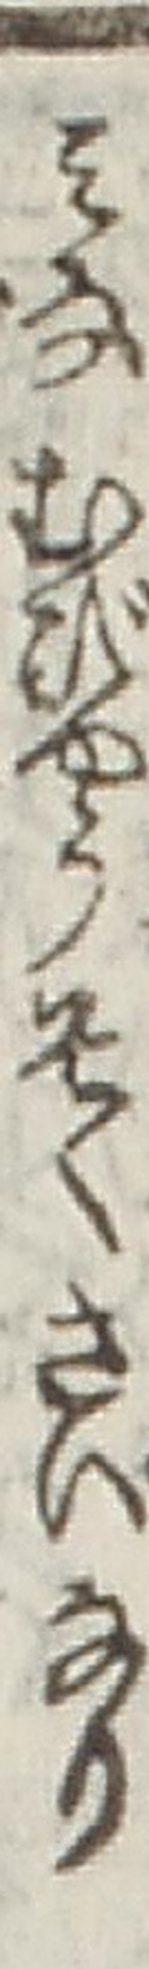みなむびやうそくさいなり
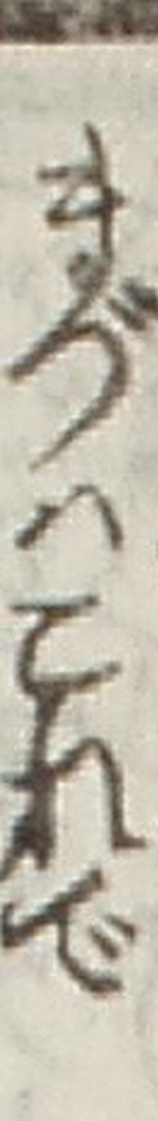まづはこれで
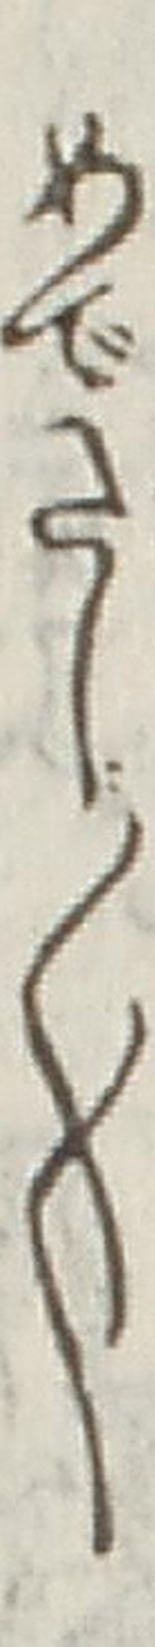めでたし〳〵〳〵
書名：三世相出雲當座帳　上下冊
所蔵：東京大学地震研究所図書室 Earthquake Research Institute Library, The University of Tokyo, JAPAN
